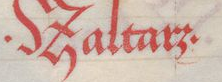.Żaltarz.
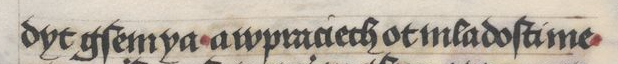dyt gſem ya.a wpracíech ot mladoſti me.
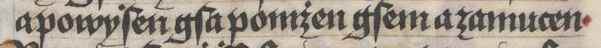a powýẛen gſa ponižen gſem a zamucen.
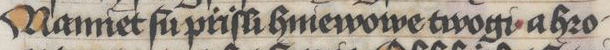Namiet ſu pṙiẛli hniewowe twogi.a hro¬
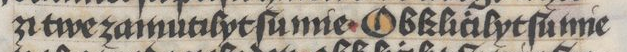zi twe zamutilyt ſu mie.Obkliċilyt ſu mie
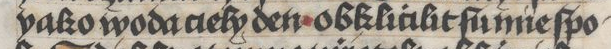yako woda ciely den.obkliċilit ſu mie ſpo¬
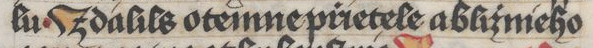lu.Zdálils otemne pṙíetele a bliżnieho
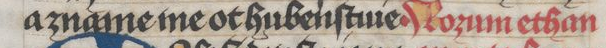a zname me ot hubenſtuíe.Rozum ethan
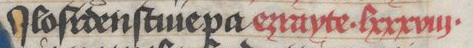Iloſrdenſtuie pa ezrayte.lxxxviii.
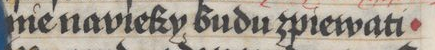nie navieky budu zpiewati.
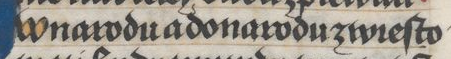Wdonarodu a donarodu zwieſto¬
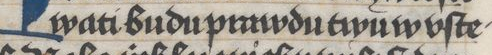wati budu prawdu twu w vſte¬
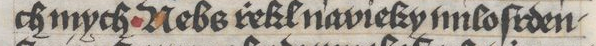ch mych.Nebs ṙekl navieky miloſrden¬
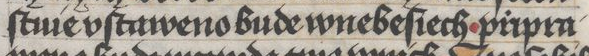ſtuíe vſtaweno bude wnebeſiech.pṙipra¬
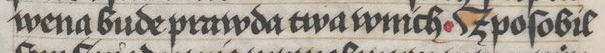wena bude prawda twa wnich.Zpoſobil
